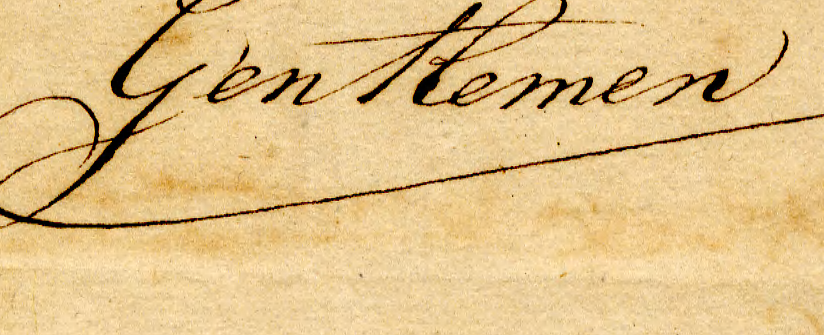Gertomen
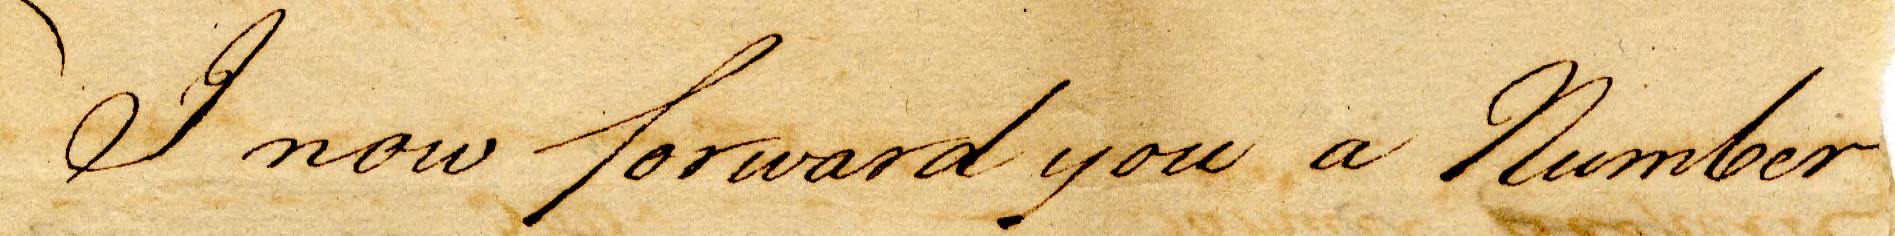I now forward you a Hlembes
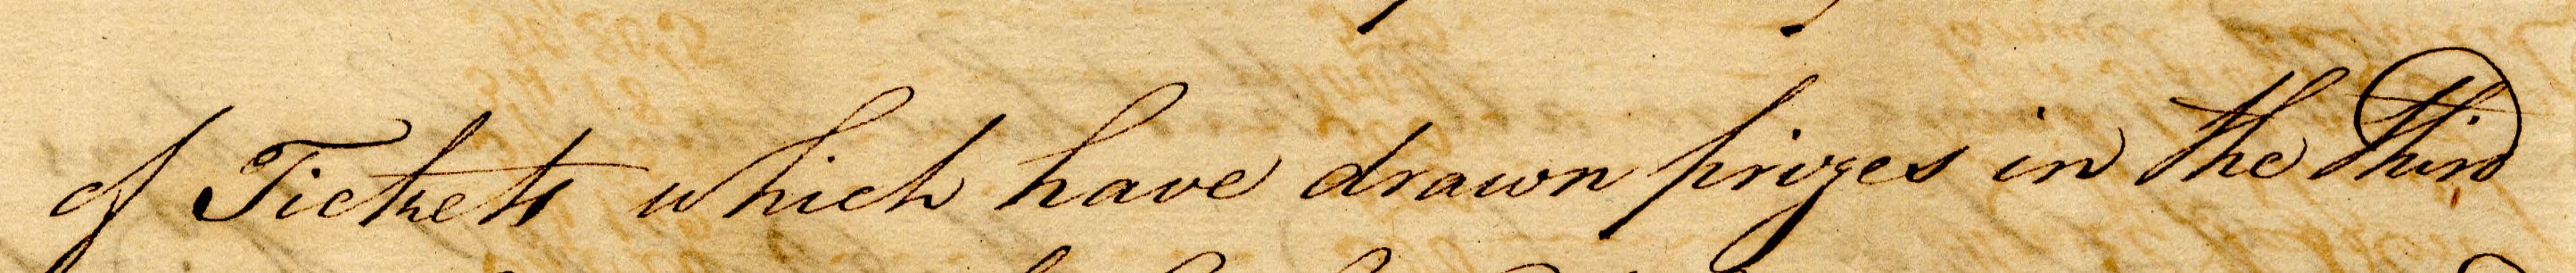of Tichets which have dawn prenes in the th
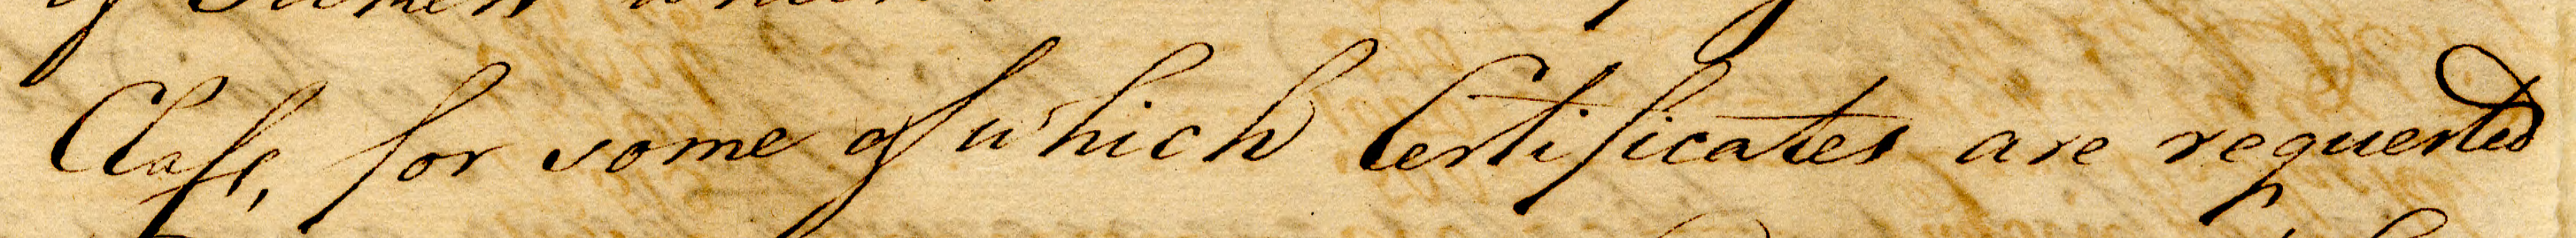Alass for some o which lestificales ae requee
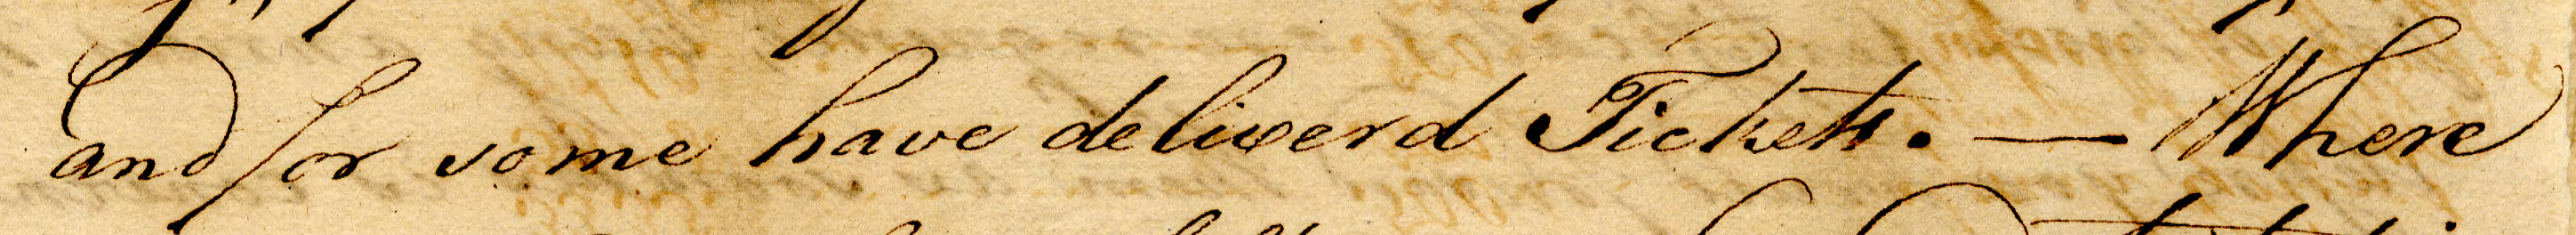andfor vome have dliverd Tickets. Mhen
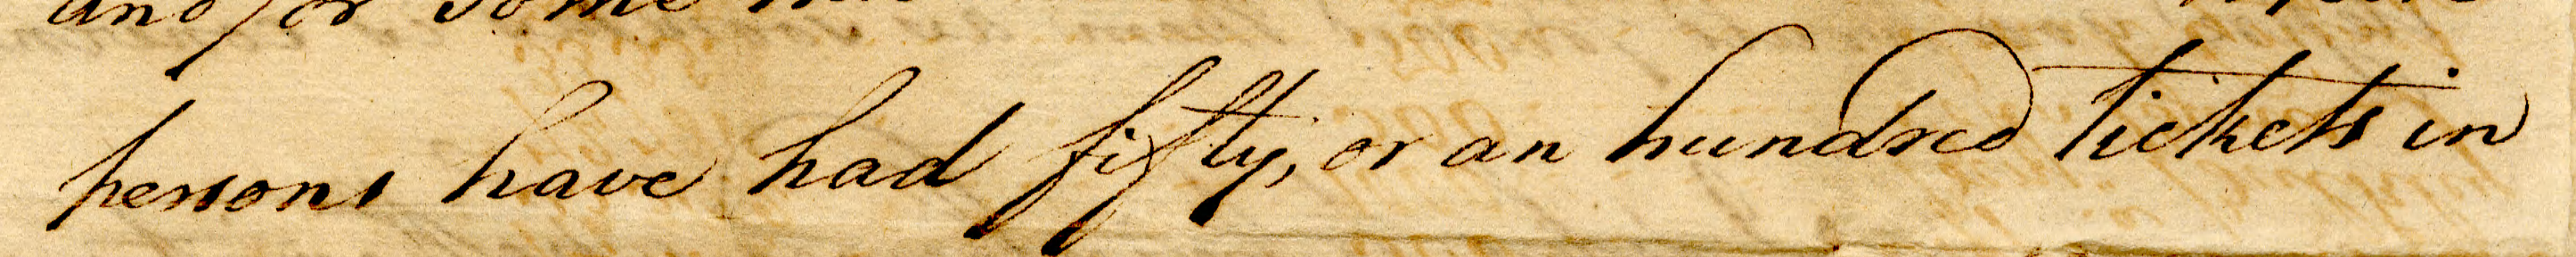herons hinve had tf byror an huntised tiches in
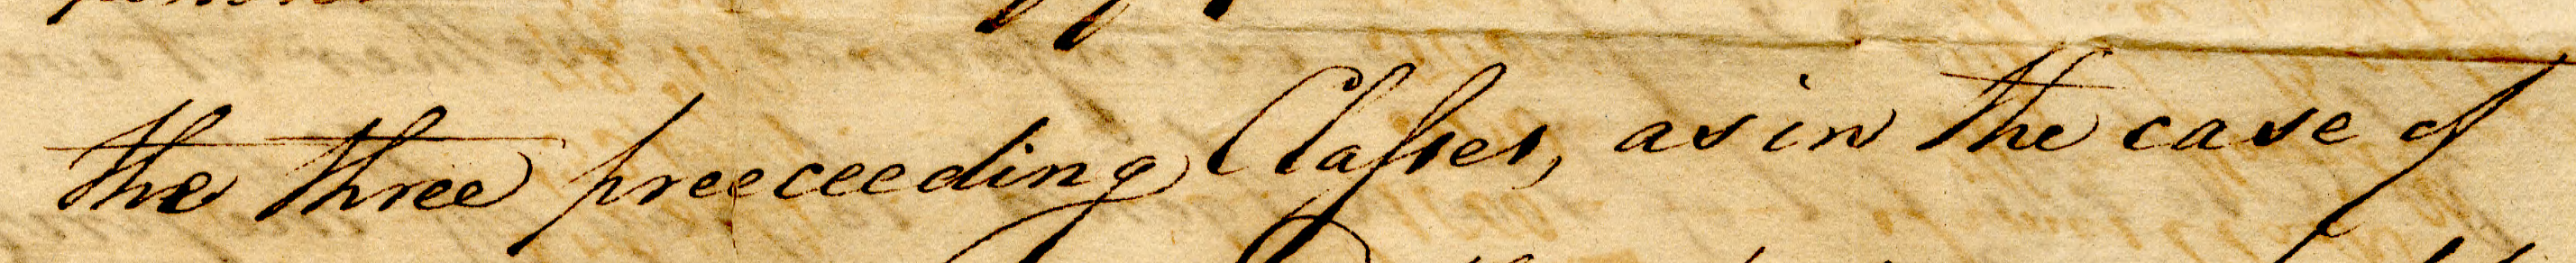the three preccceatnotlasses, avin the case of
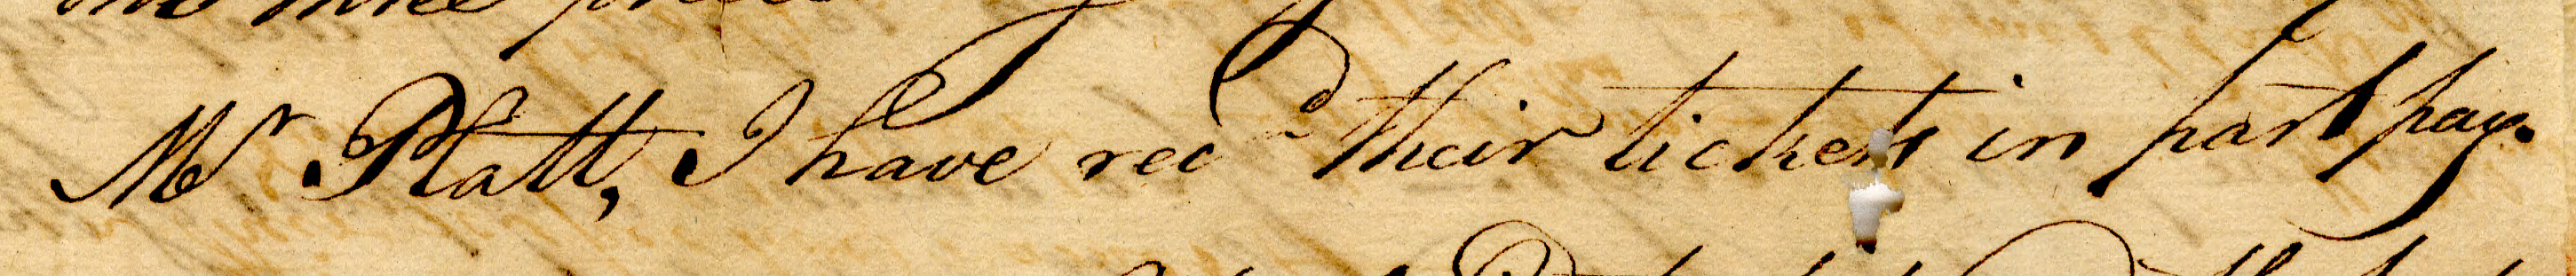M Slid Ihave red thees teket in pa bly
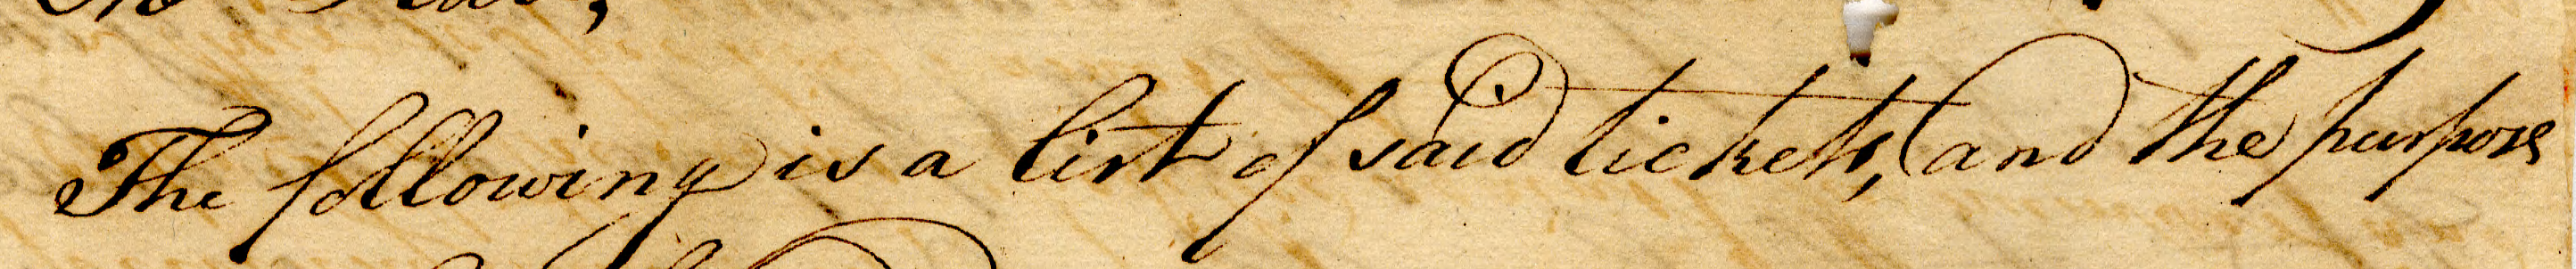the sillowing wsa tort of sad ticketsend the pan
